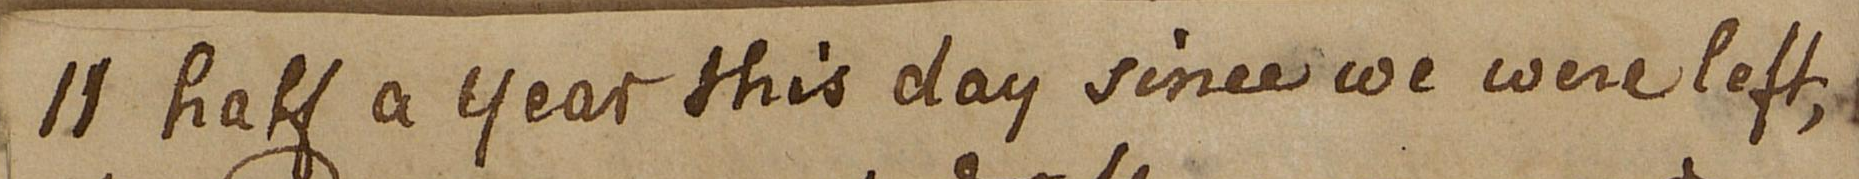11 half a year this day since we were left,
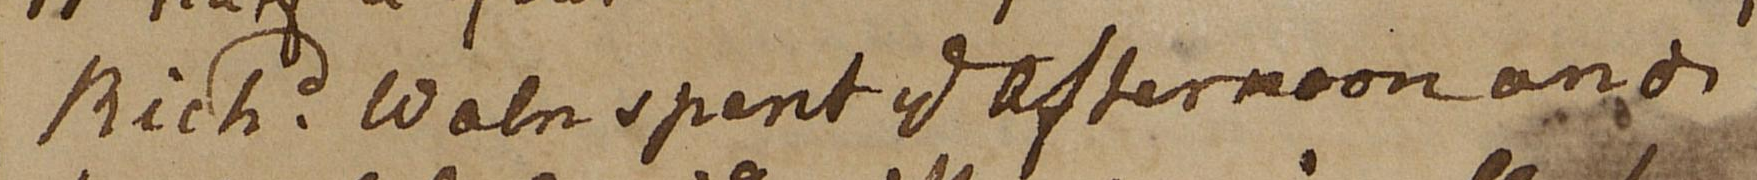Rich^d. Waln spent y^e afternoon and
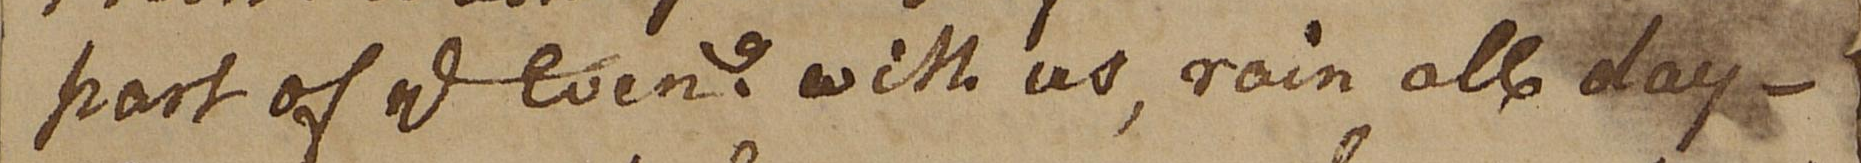part of y^e Even^g. with us, rain all day-
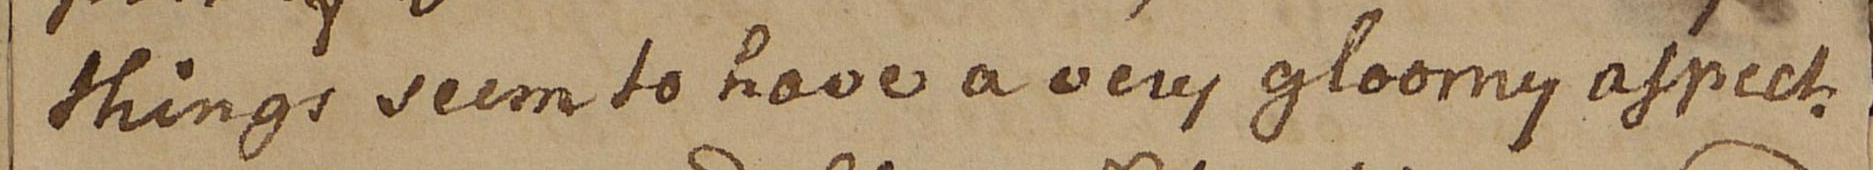things seem to have a very gloomy aspect.
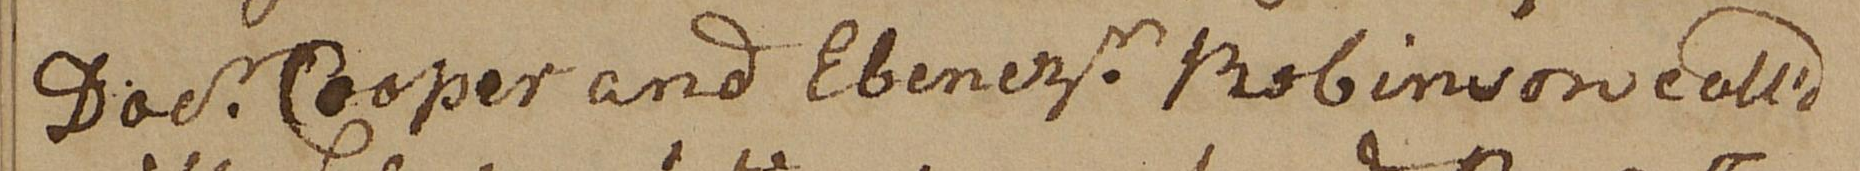Doc^r. Cooper and Ebenez^r. Robinson call'd
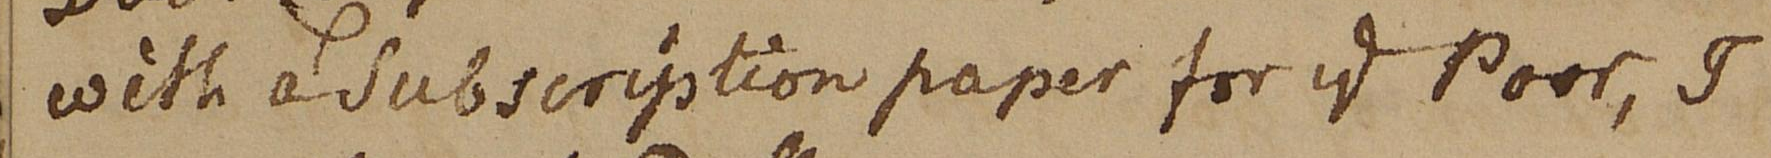with a Subscription paper for y^e Poor, I
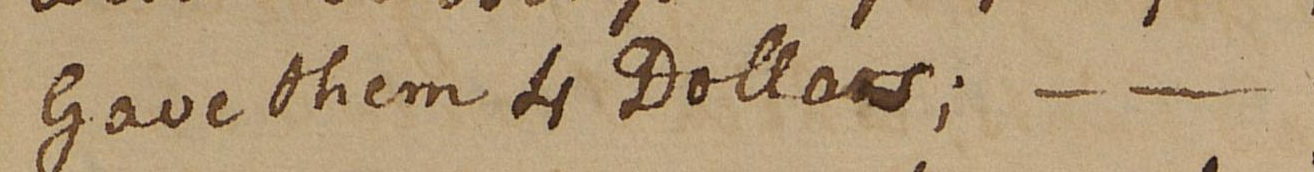Gave them 4 Dollars;--
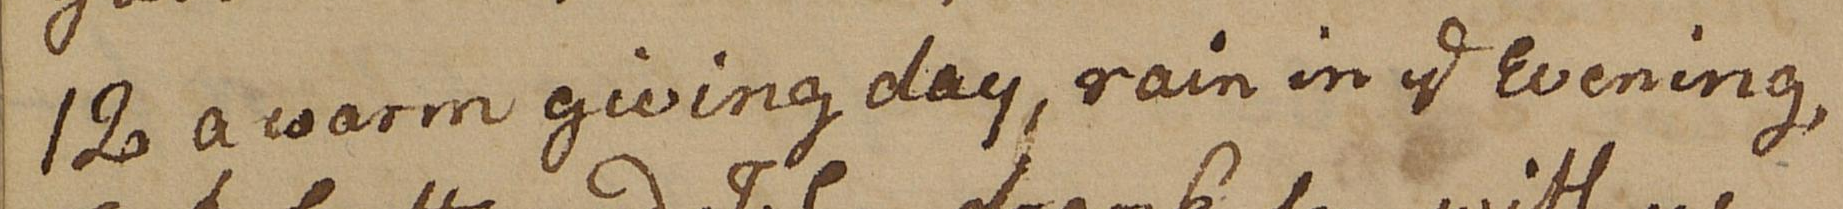12 a warm giving day, rain in y^e Evening,
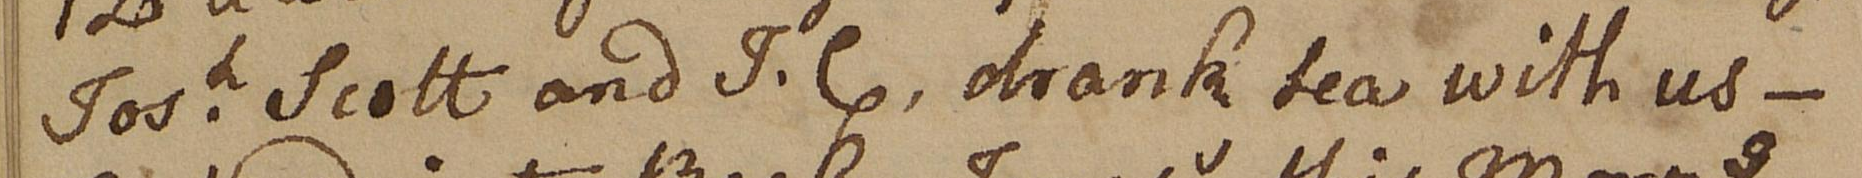Jos^h. Scott and J.C, drank tea with us-
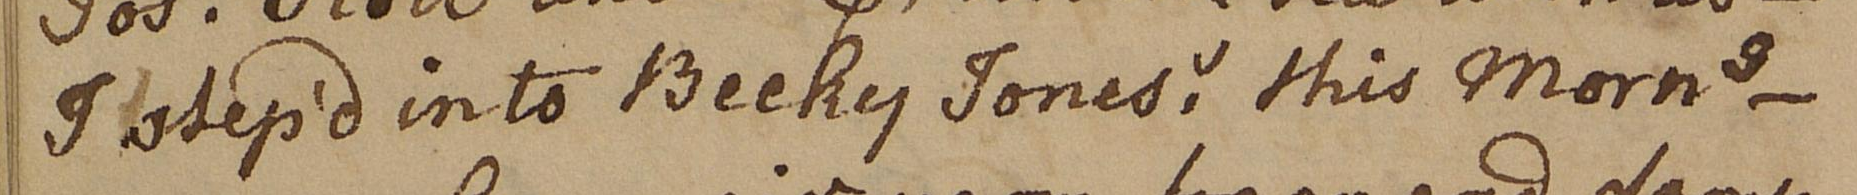I step'd into Becky Jones^s. this morn^g-
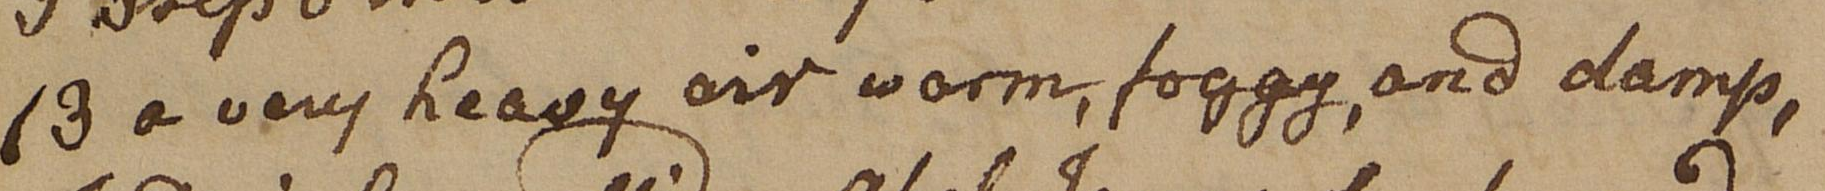13 a very heavy air warm, foggy, and damp,
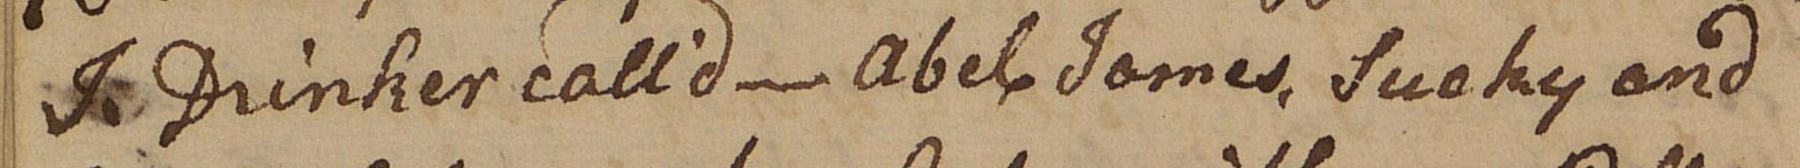J. Drinker call'd- Abel James, Sucky and
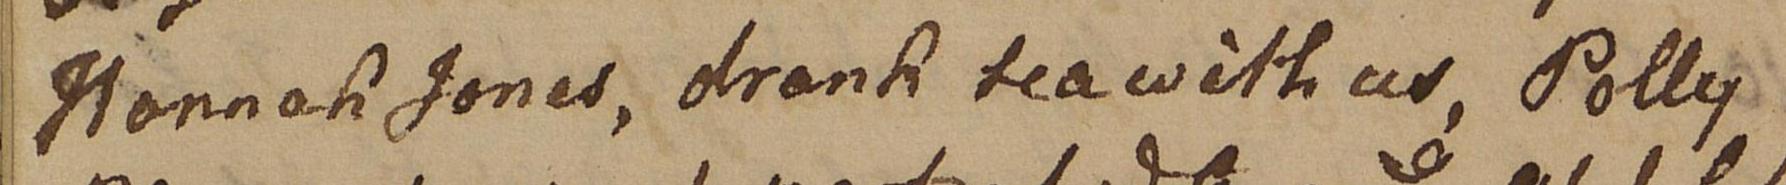Hannah Jones, drank tea with us, Polly
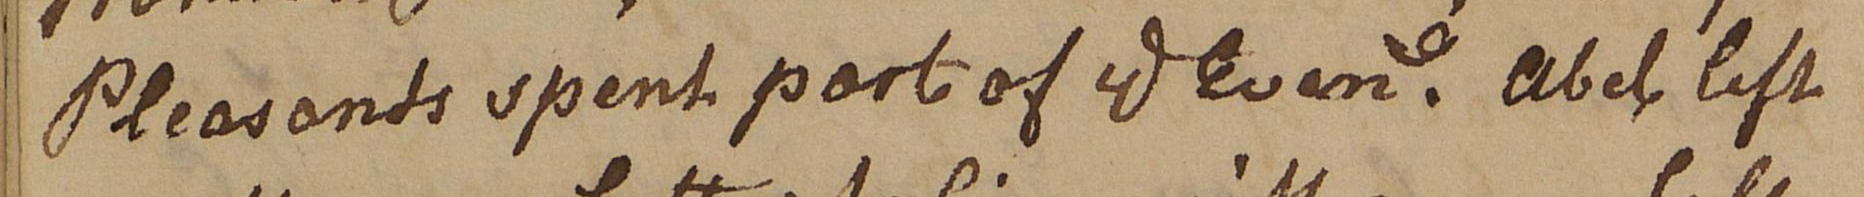Pleasants spent part of y^e Even^g. Abel left
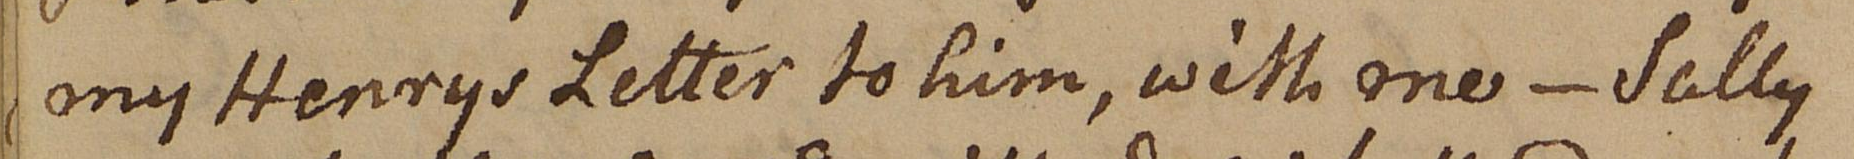my Henrys Letter to him, with me- Sally
